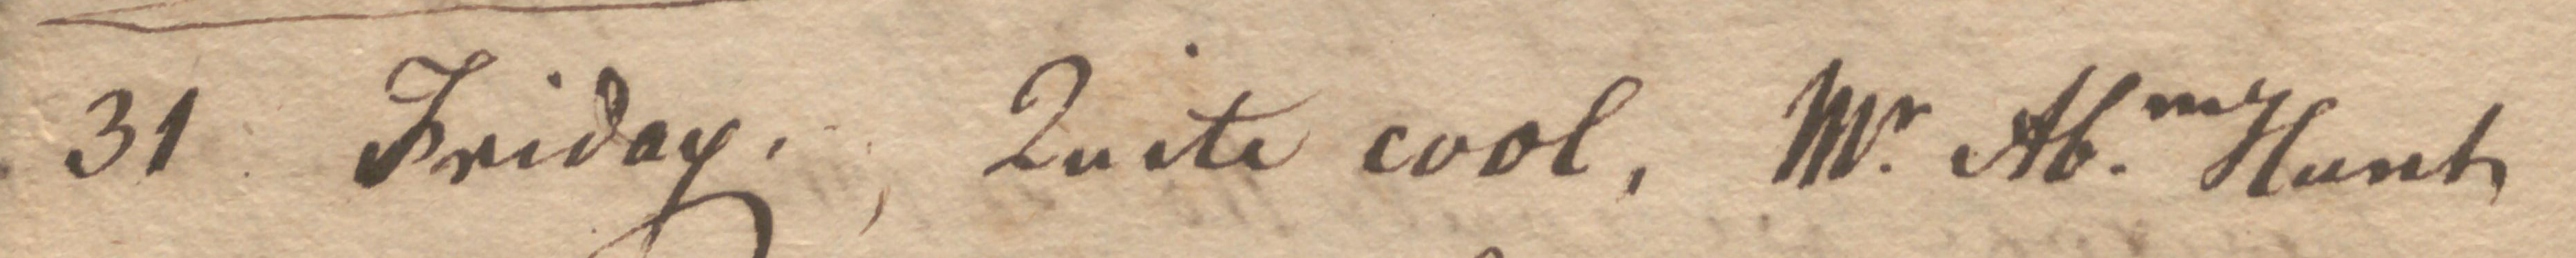31 Friday. Quite cool, M^r. Ab^m. Hunt
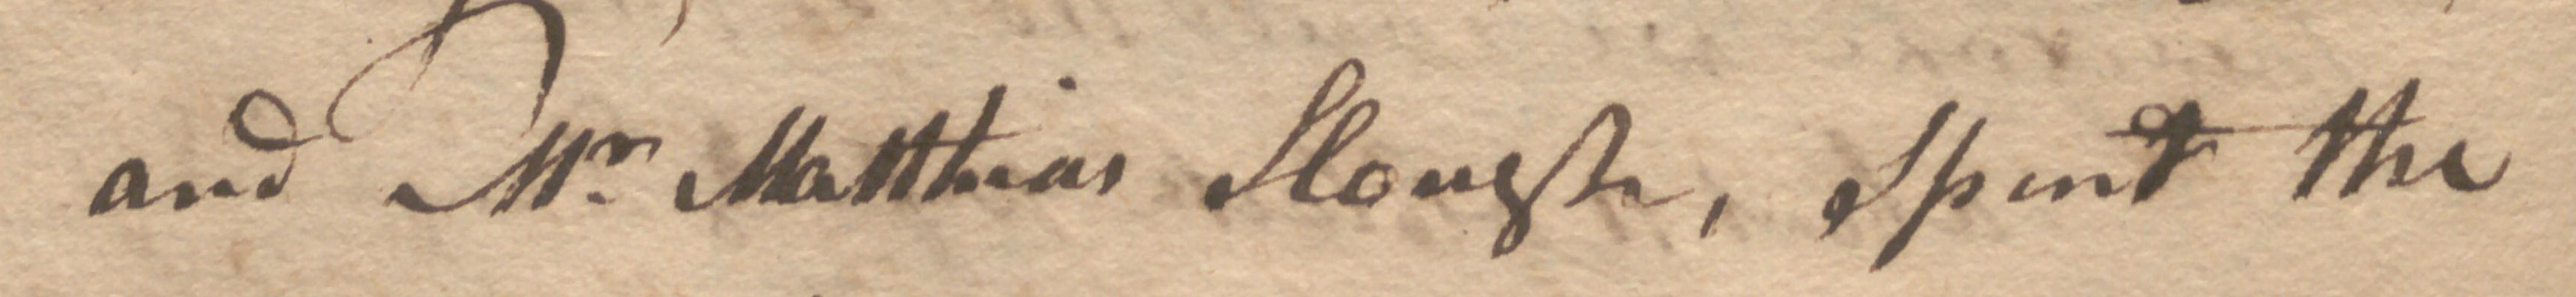and M^r. Matthias Slough, spent the
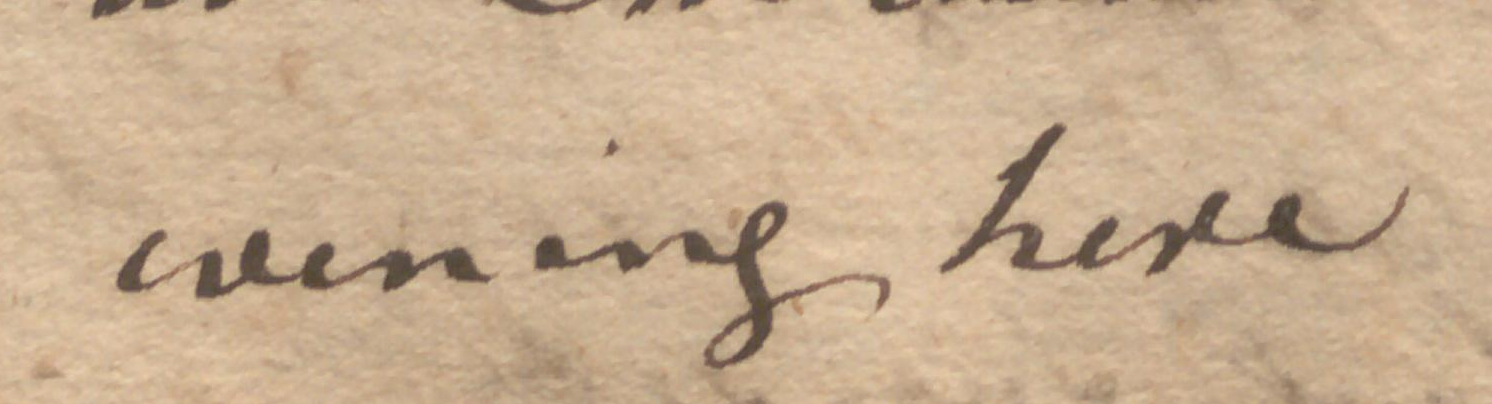evening here
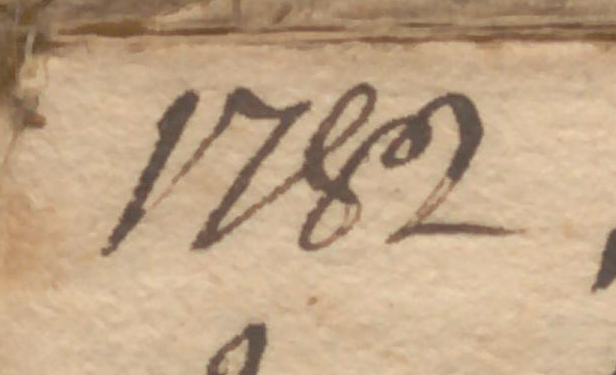1782
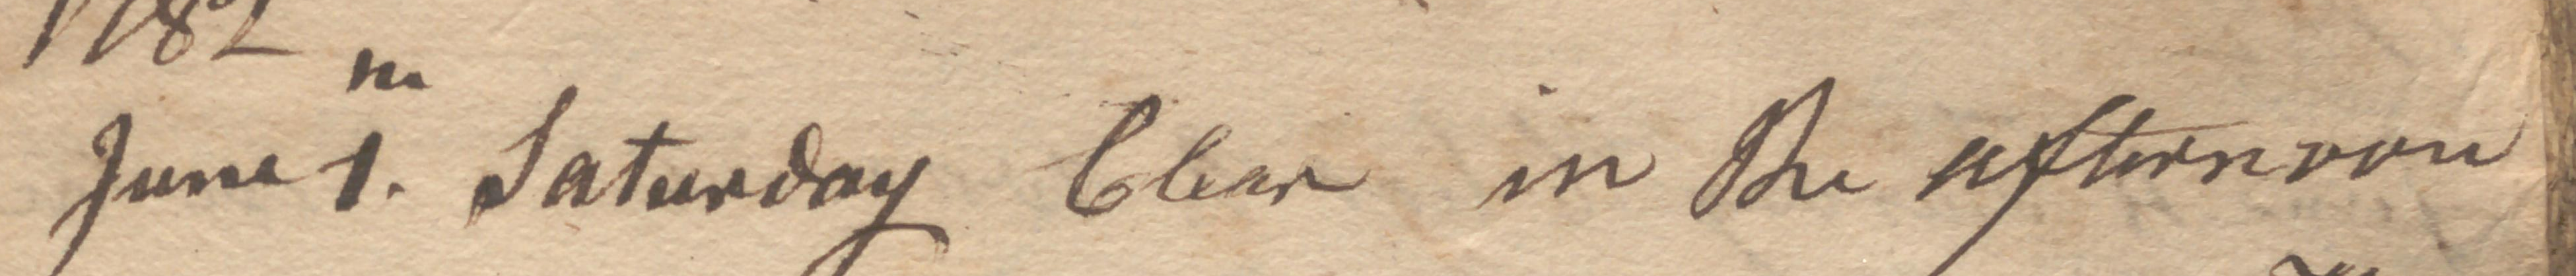June 1^th. Saturday Clear in the afternoon
